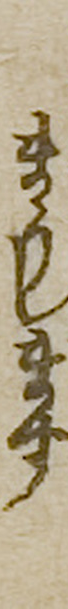まうします
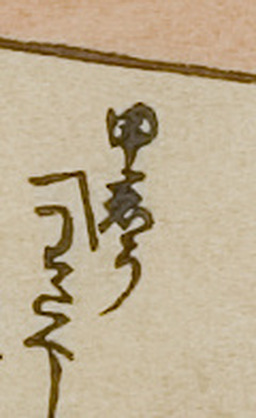甲しう
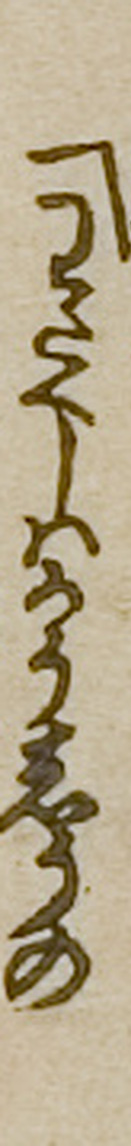「わたくしはかうしうの
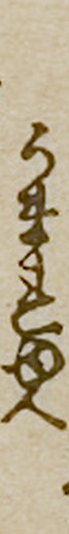うまれゆへ
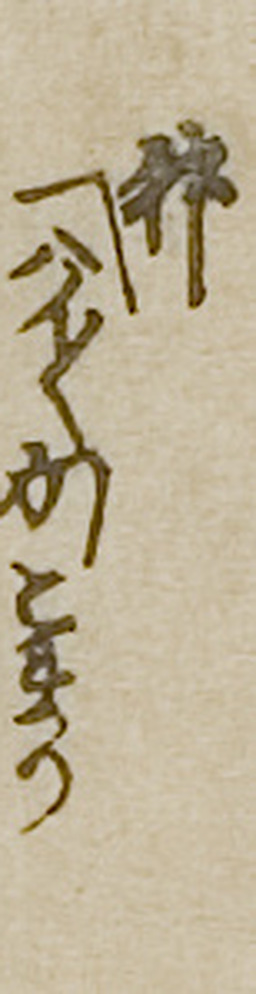「はい〳〵かしこまり
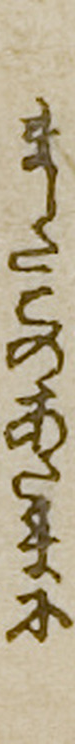ましたこのあたまに
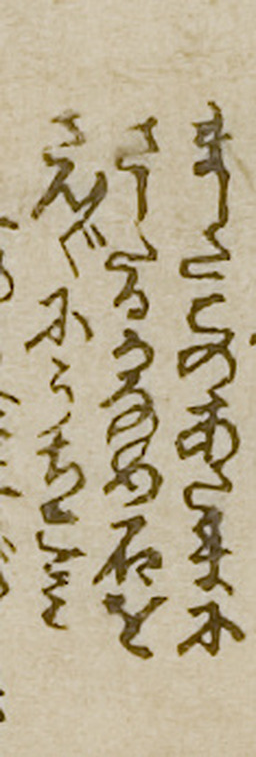さしたるかなめ石を
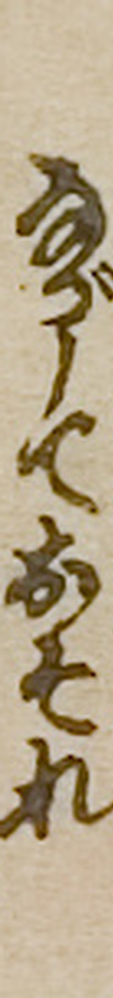ながしておそれ
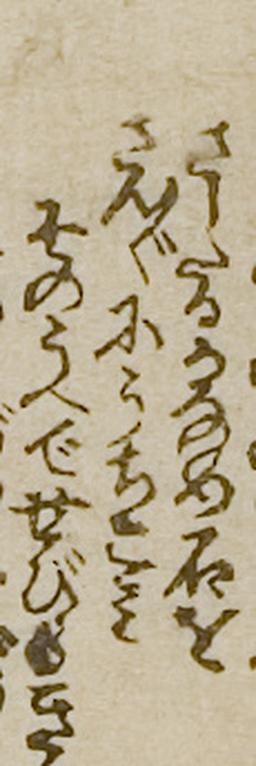さん〴〵にうちこみ
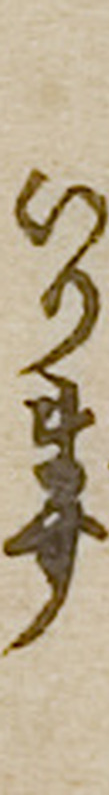いります
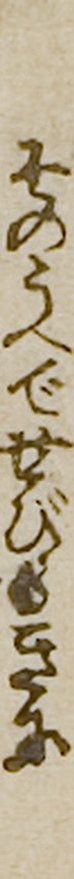そのうへでせびらきに
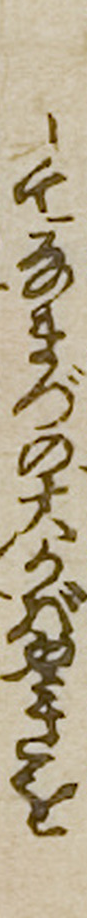してなまづの大かばやきを
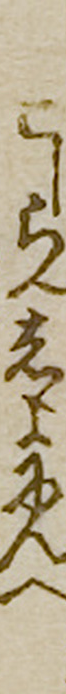こしらへしよにんへ
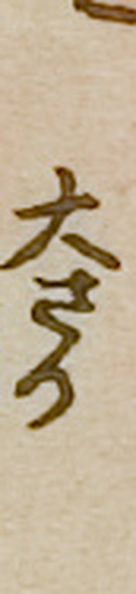大さか
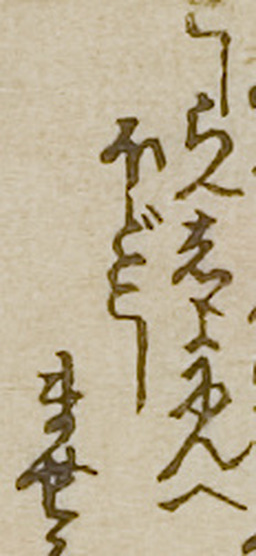ほどこし
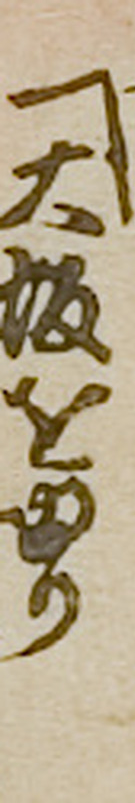「大坂をゆり
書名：[地震鯰の取り調べ]
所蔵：東京大学総合図書館 General Library in the University of Tokyo, JAPAN
